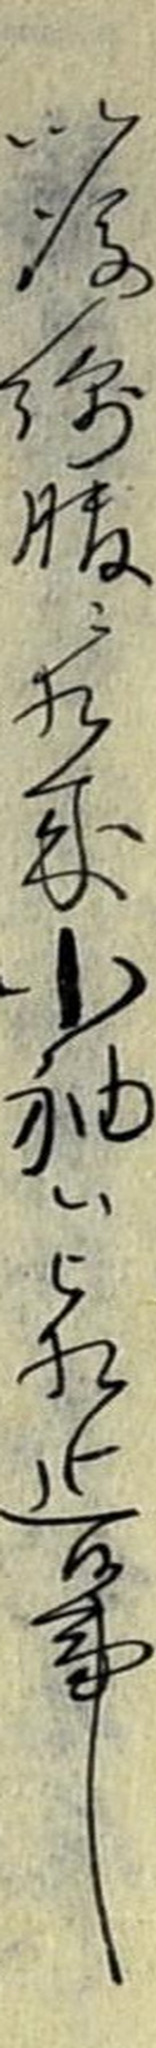以後綿服に相成小袖は被相止候事
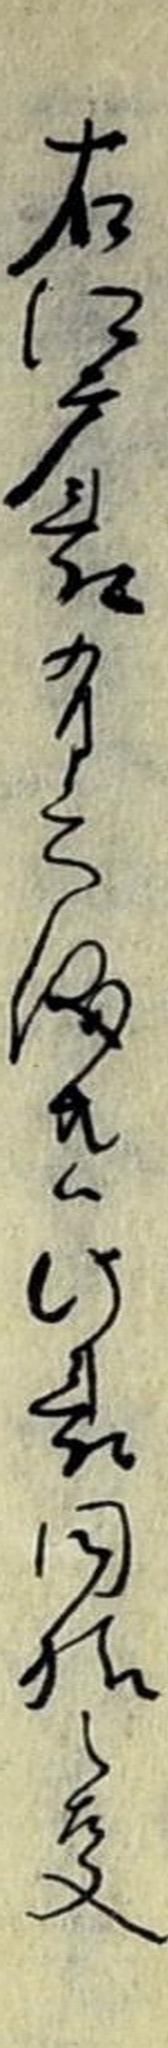右江戸表有之儀共は此表同様之事
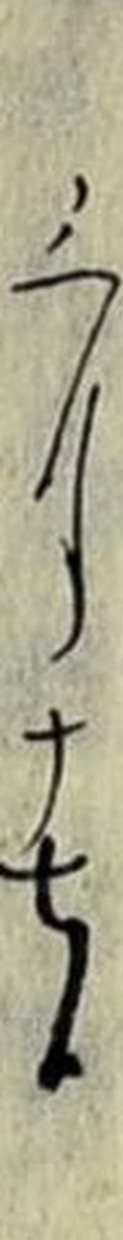三月十七日
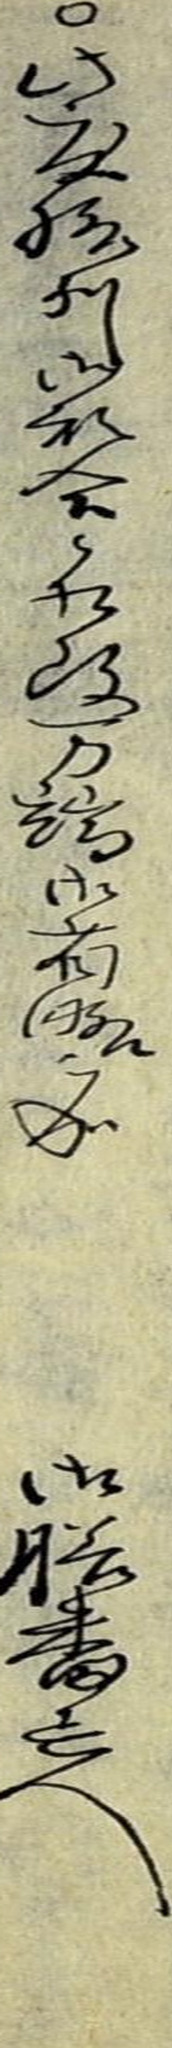〇此度格別御形合被相改万端御省略被成御膳番壱人
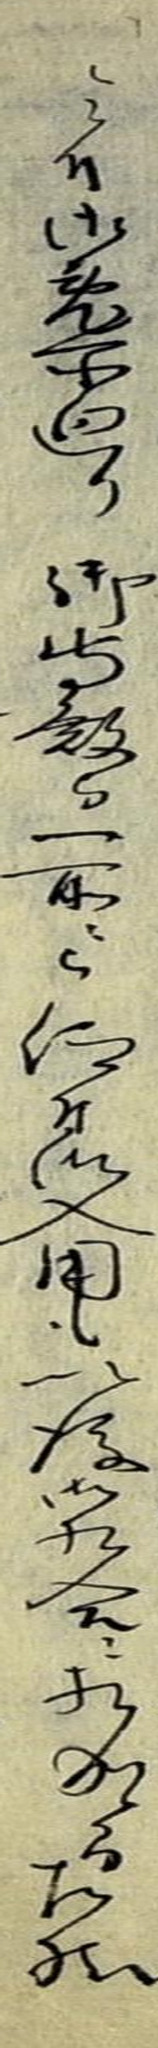候に付御台所廻り御守殿与一所に被仰付御入用も以後御相合に相成候間左様
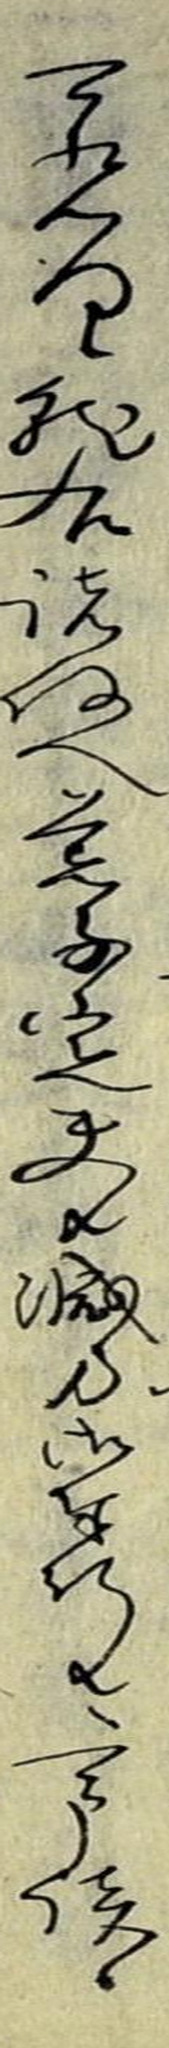可相心得候就右諸役人荒子定夫共減方御奉行共へ可申談候
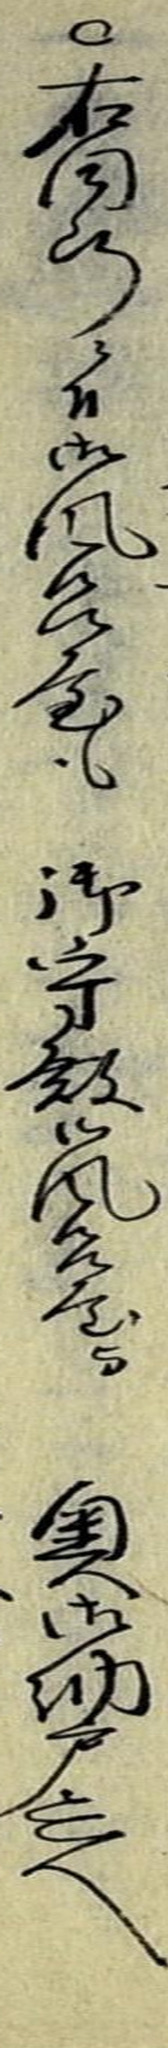〇右同断に付御風呂屋も御守殿御風呂屋与奥御納戸壱人
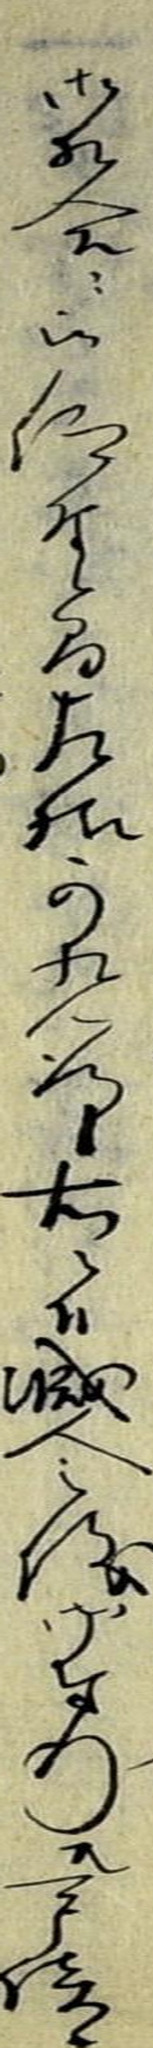御相合に被仰付候間左様可相心得候右に付減人之儀御奉行共可申談候
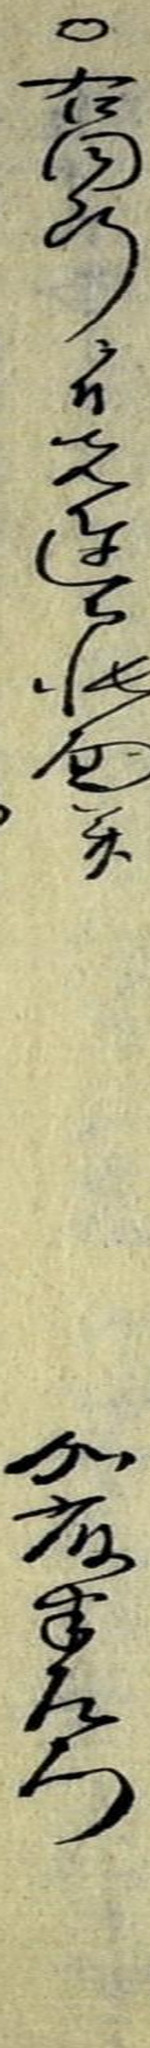〇右同断に付先達而帳面并加藤半左衛門
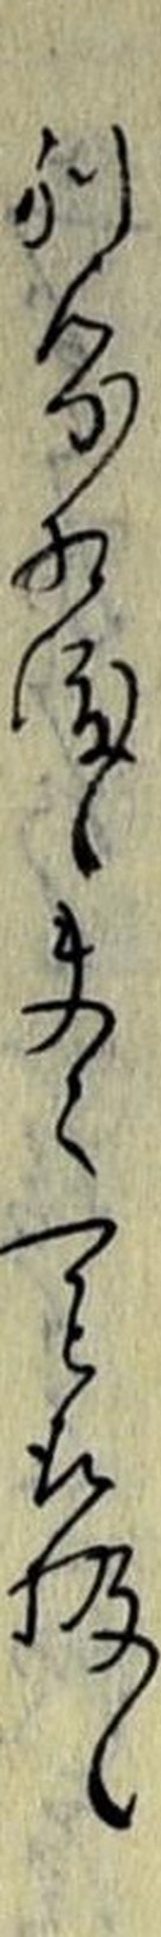別紙相渡候夫々可被取扱候
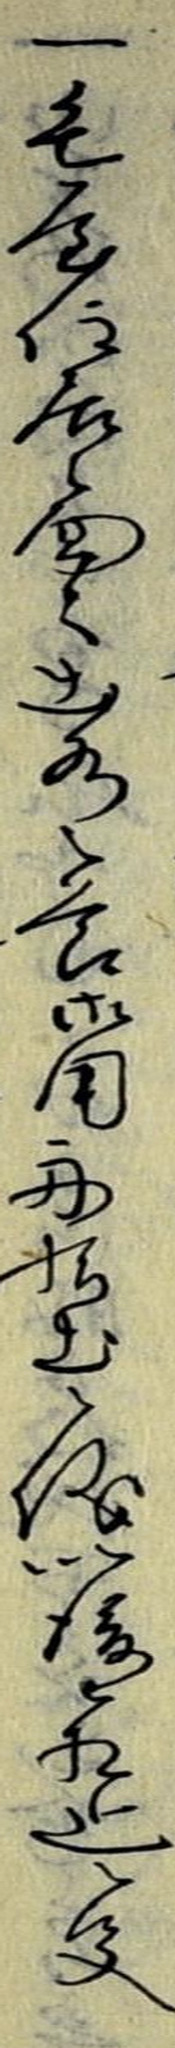一毛屋住居之面々出水之節御用舟指出候儀以後被相止候事
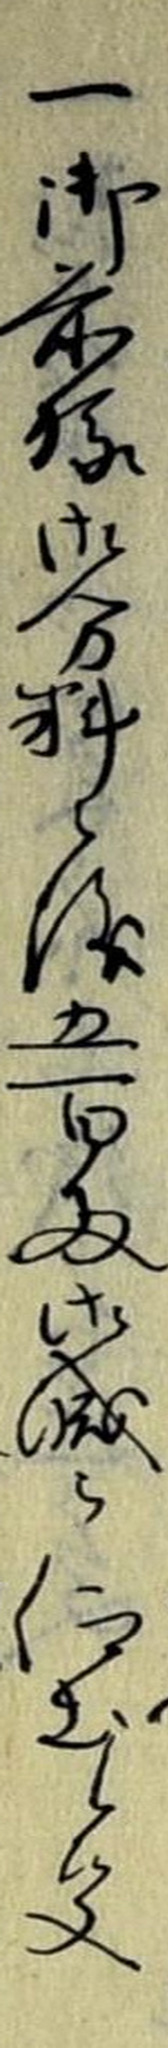一御前様御分料之儀五百両御減被仰出候事
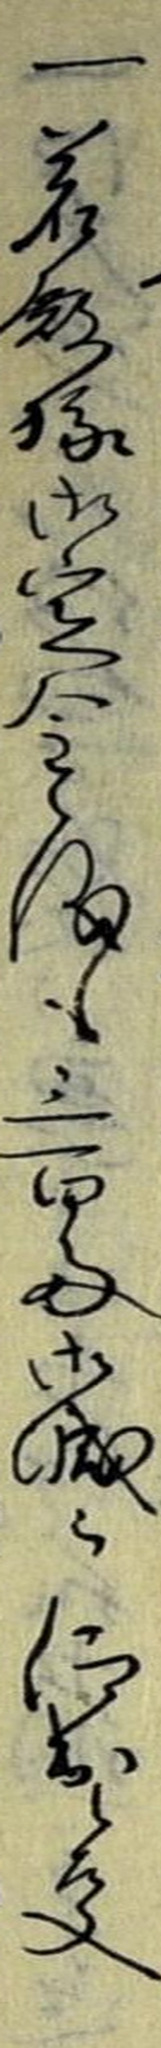一若殿様御定金之儀も三百両御減被仰出候事
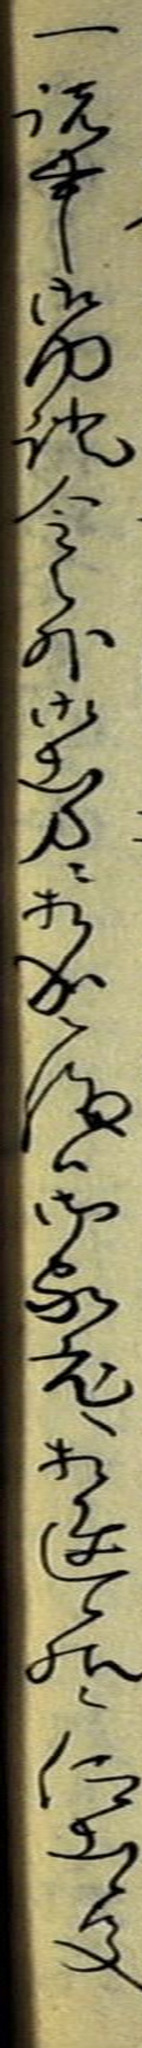一諸事御内証金之外御出方に相成候儀は御家老へ相達候様被仰出候事
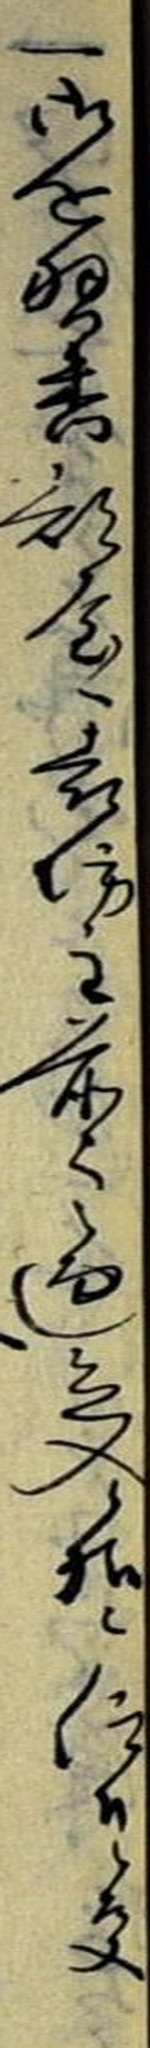一御近習番部屋へ表坊主前々之通立入候様被仰付候事
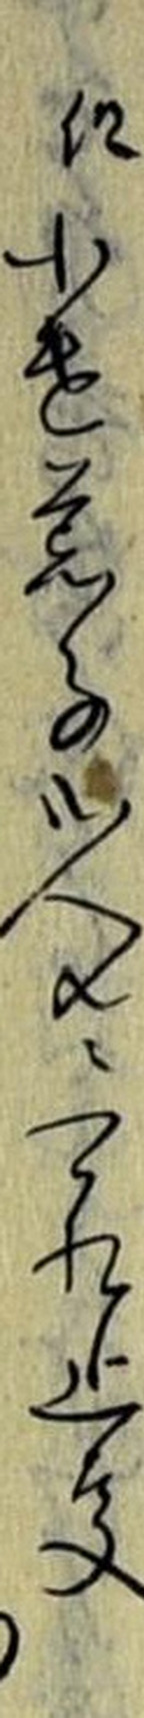但小遣荒子弐人共に可相止事
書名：命令之部 二
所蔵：福井県文書館 Fukui Prefectural Archives
